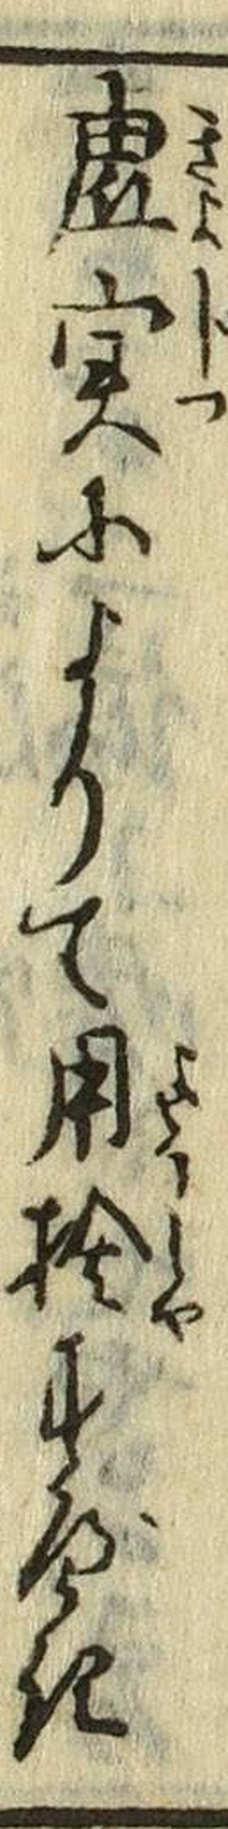虚実によりて用捨すべき
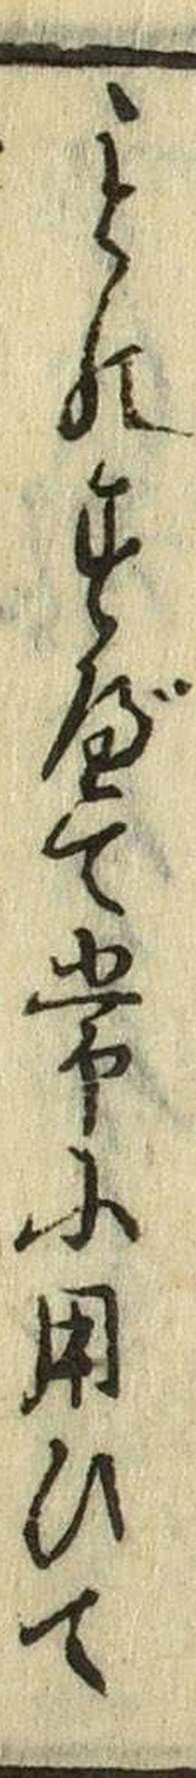ものすべて常に用ひて
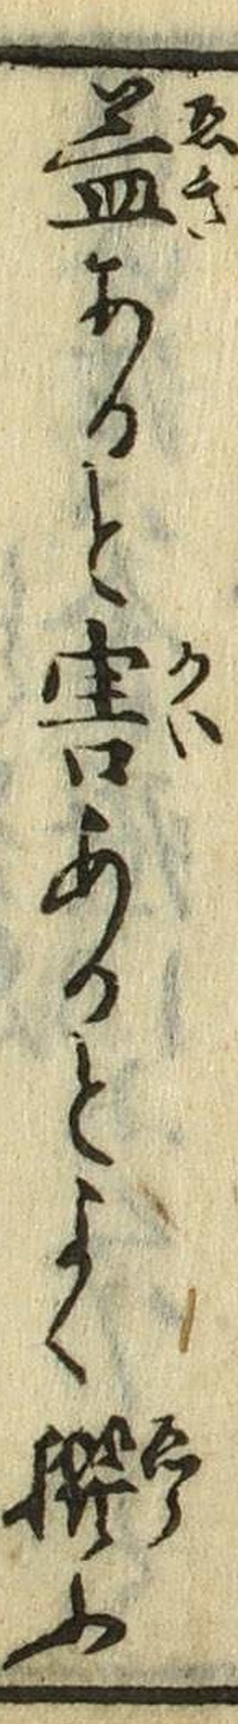益あると害あるとよく撰ふ
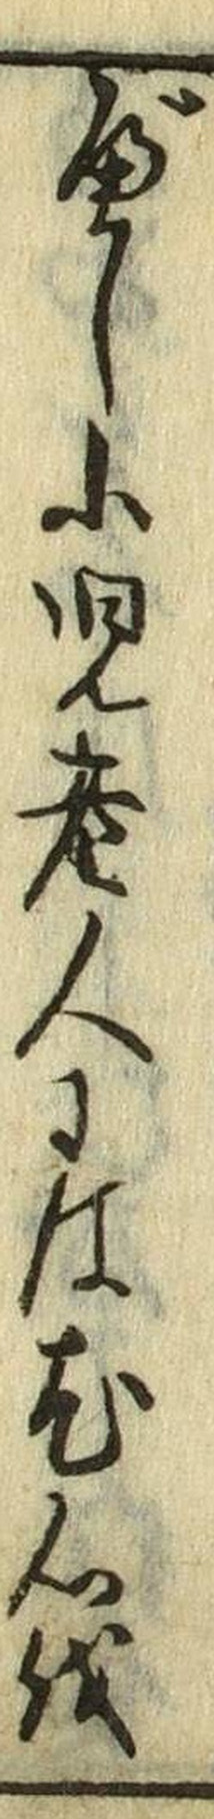べし小児老人には尤心を
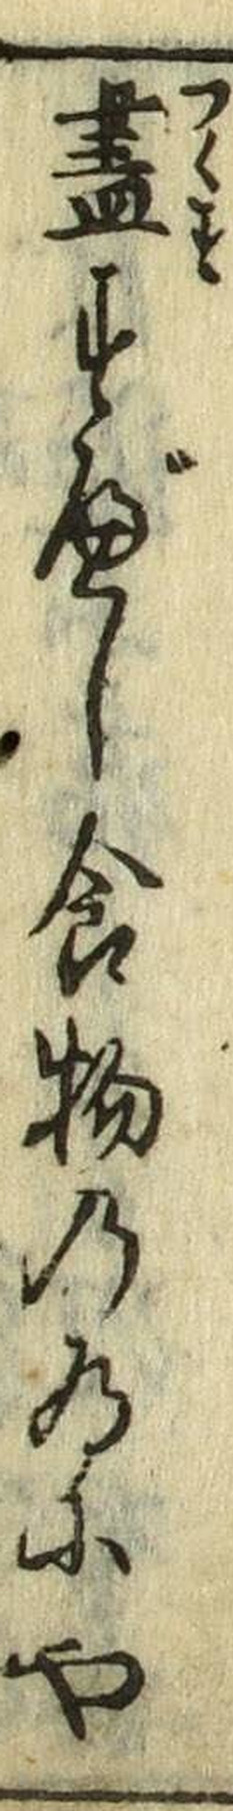尽すべし食物の為にや
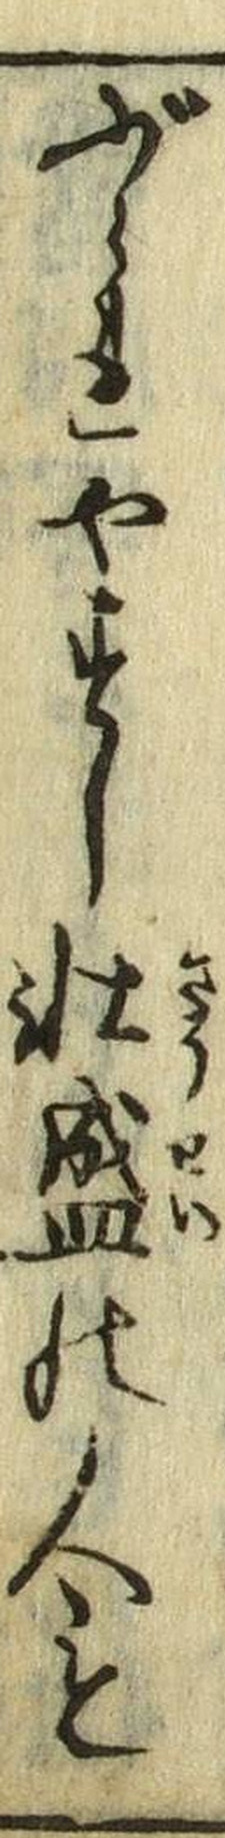ぶられやすし壮盛の人も

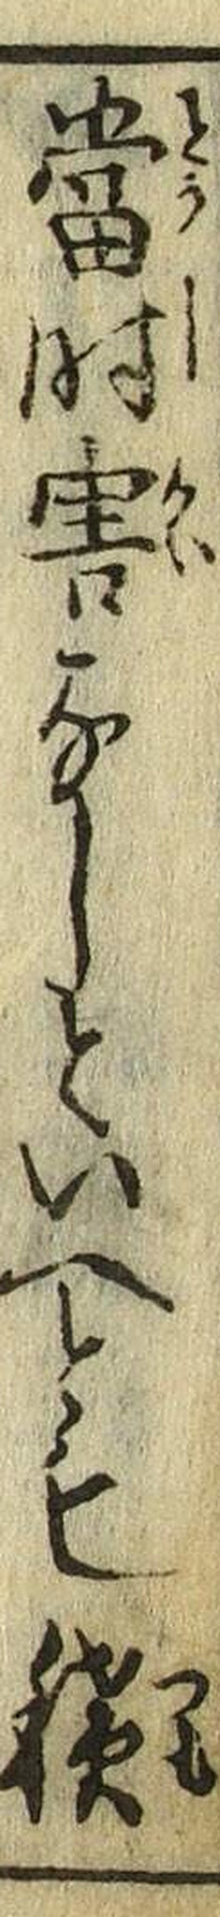当時害なしといへとも積
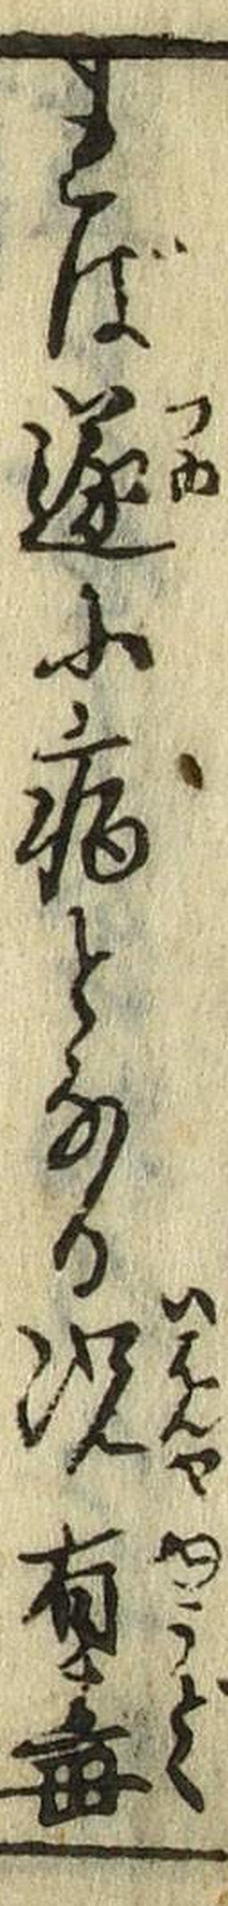れば遂に病となる況有毒
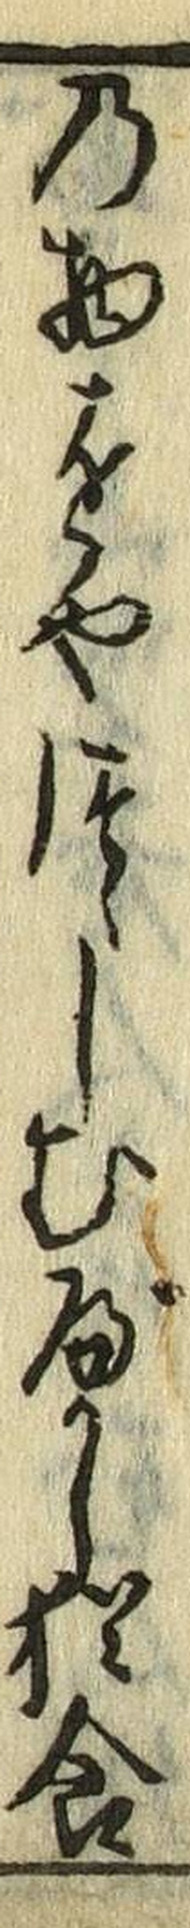の物をやつゝしむべし猶食
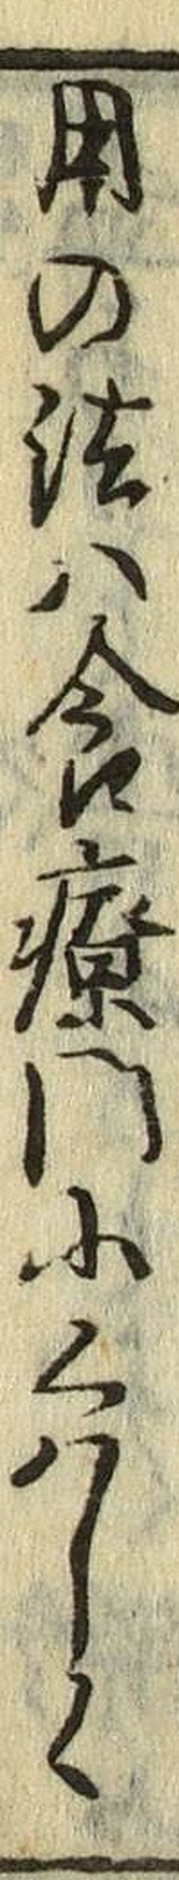用の法は食療門にくはしく
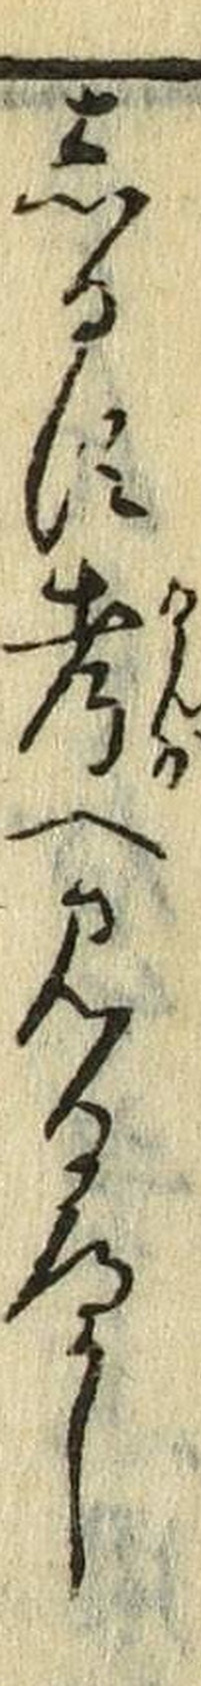しるす考へ見るへし
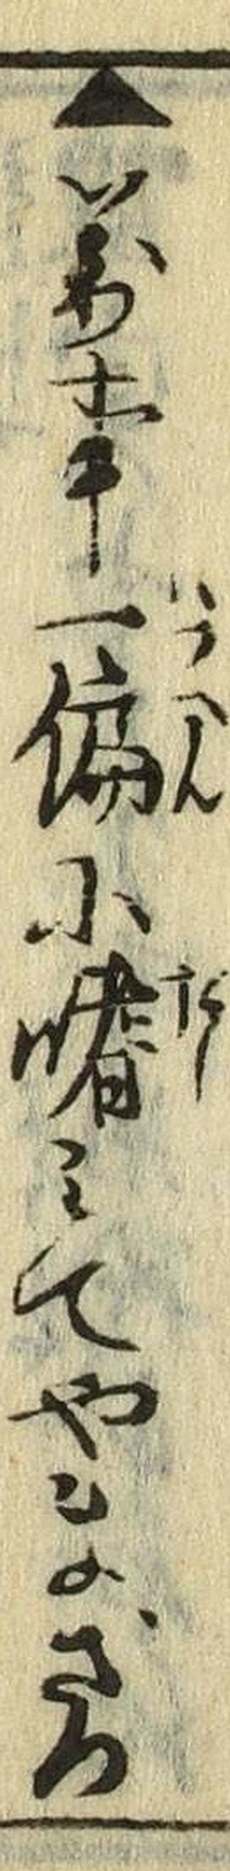▲万事一篇に嗜みてやまざる
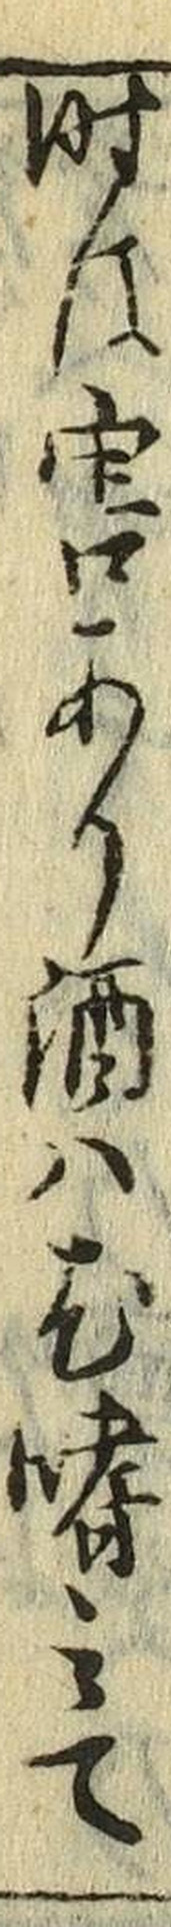時は害あり酒は尤嗜みて
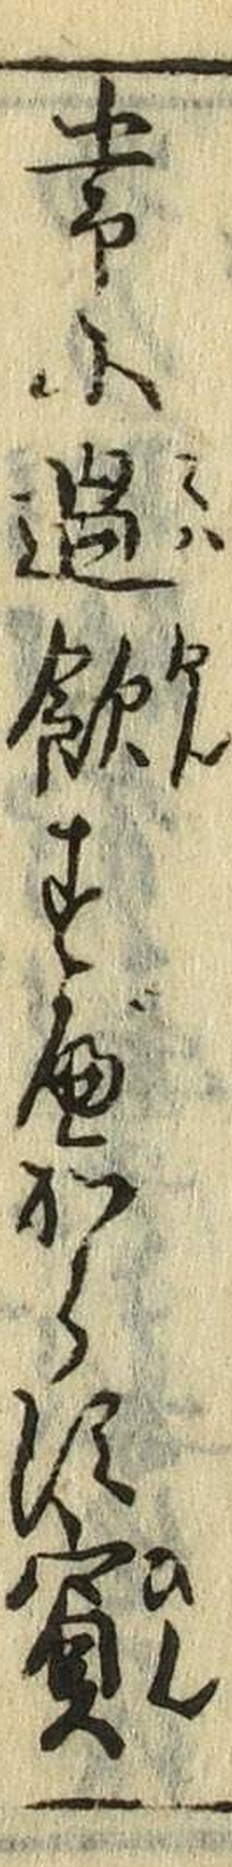常に過飲すべからす賓
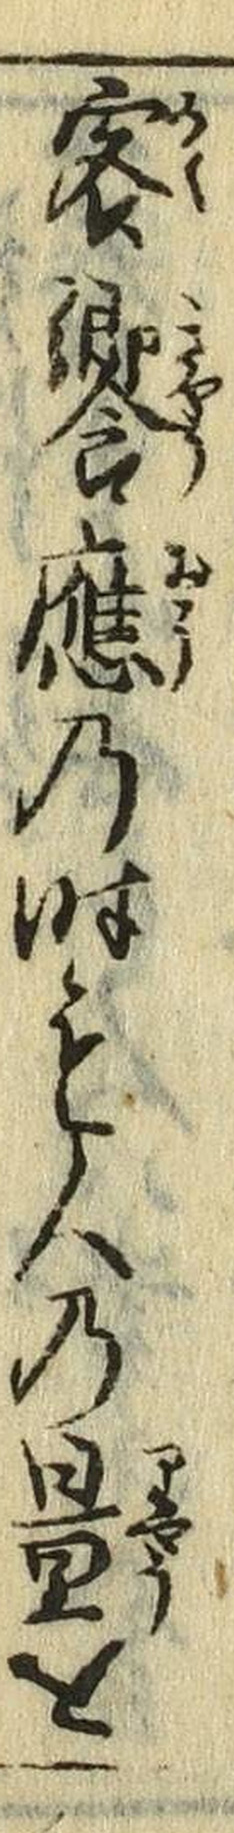客饗応の時も人の量を
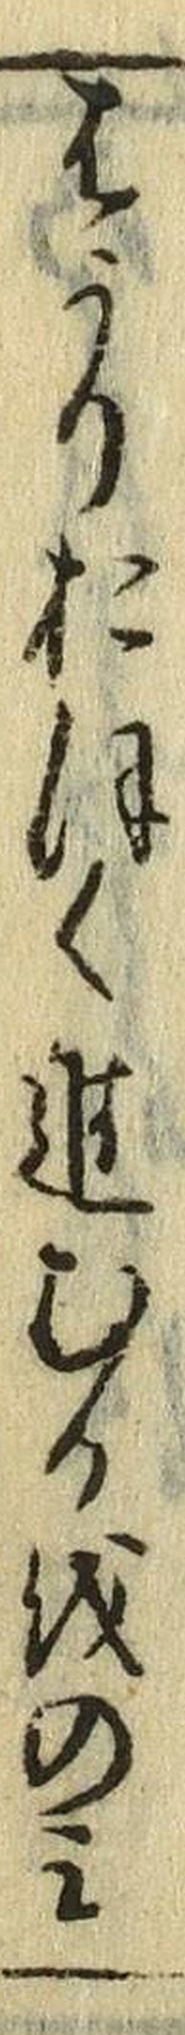はかりおほく進むるをのみ
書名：居家養生記
